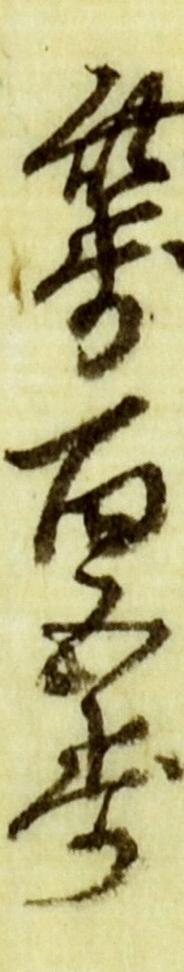此歩百五歩
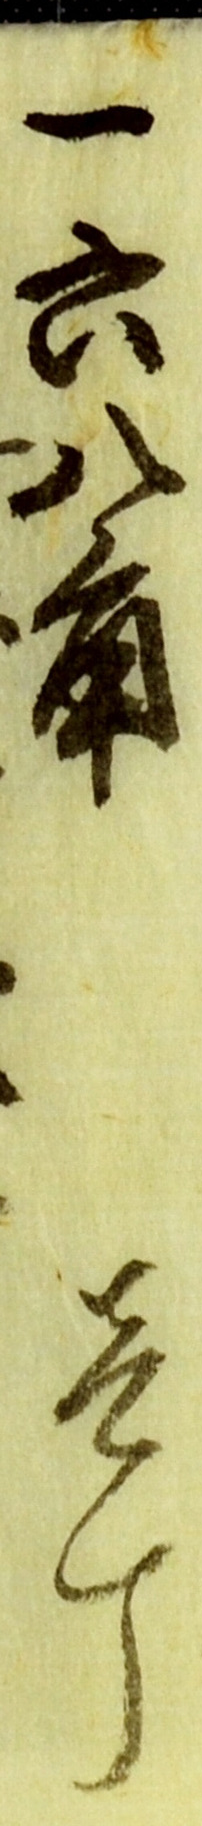一六八角壱丁
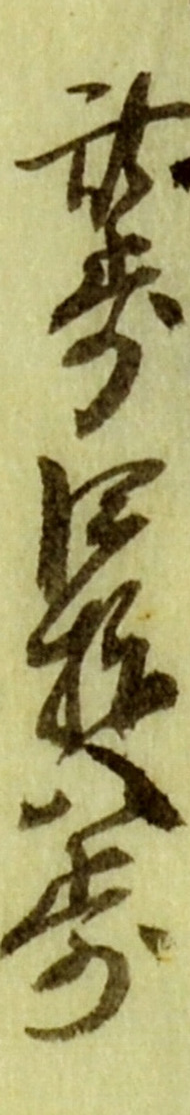此歩四拾八歩

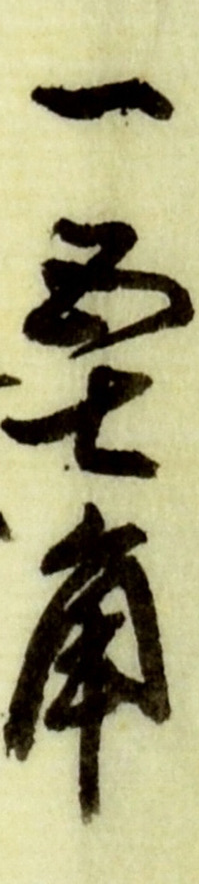一五七角
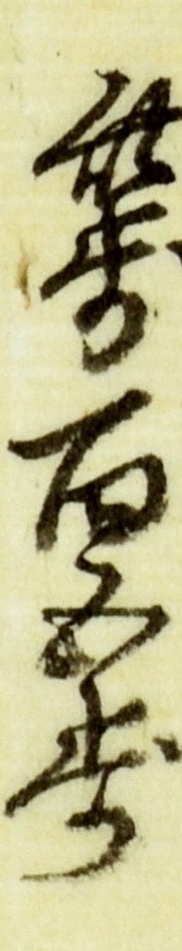此歩百五歩
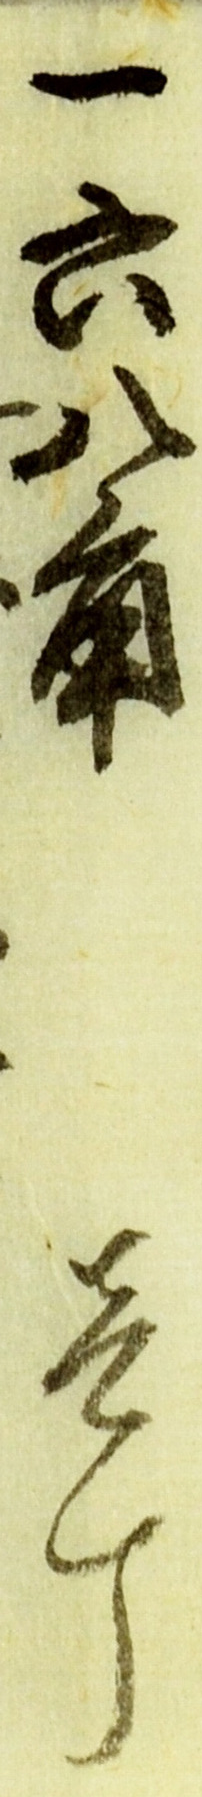一六八角壱丁
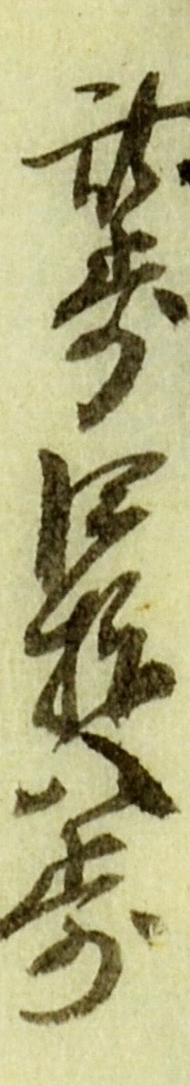此歩四拾八歩
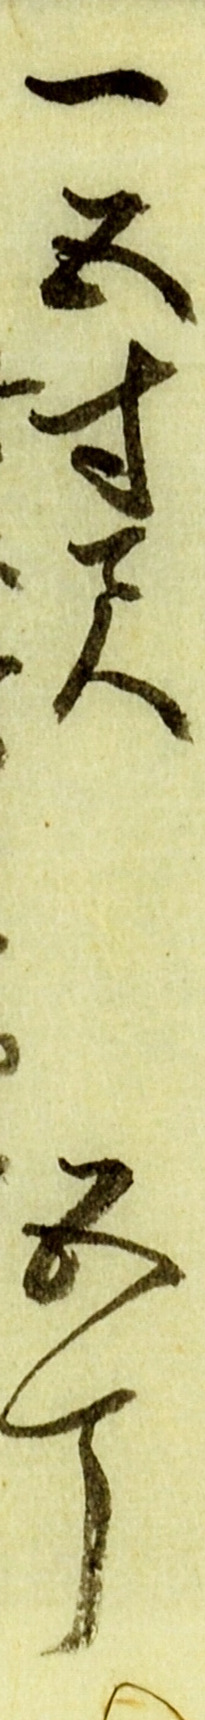一五寸尺五丁
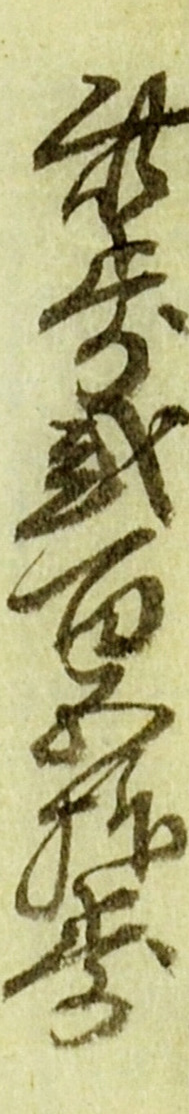此歩弐百五拾歩
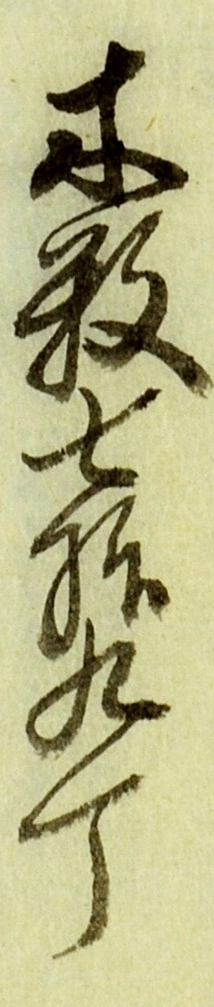木数七拾九丁
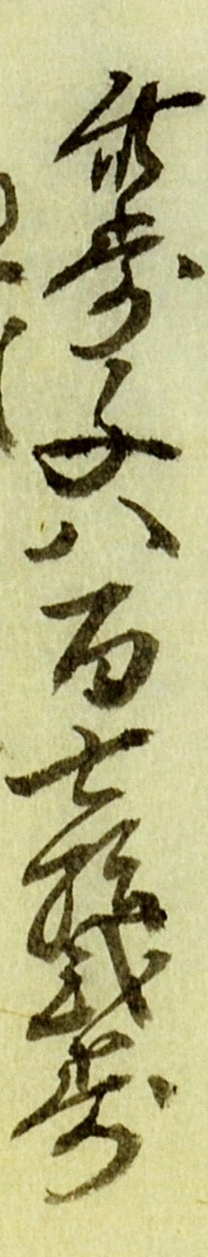〆此歩千八百七拾弐歩
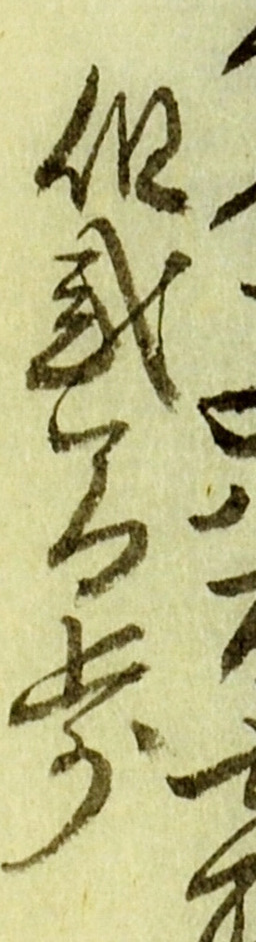但弐百歩
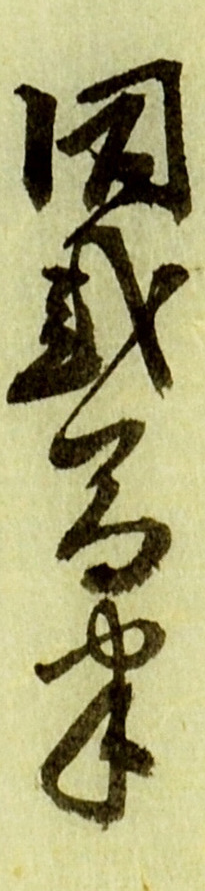同弐百半
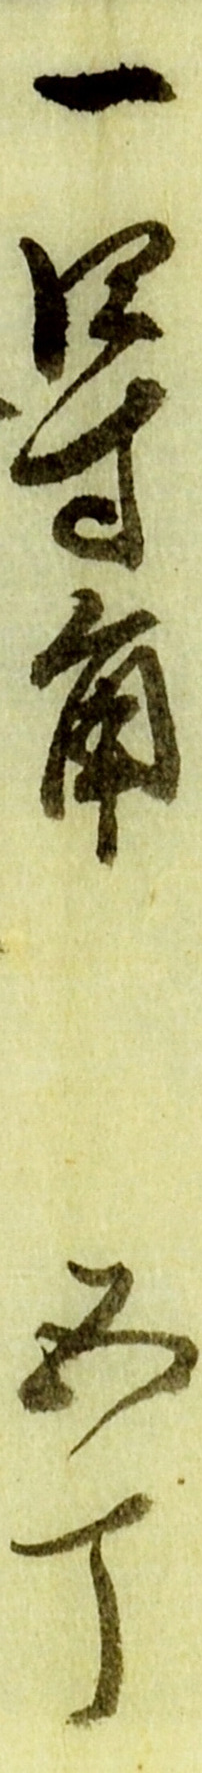一四寸角五丁
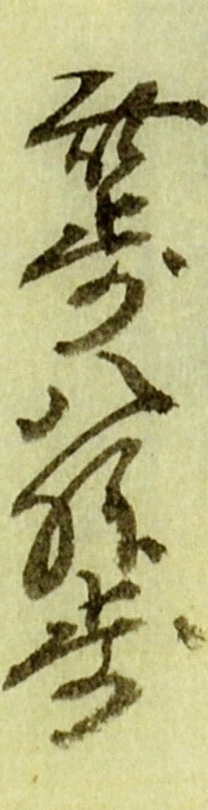此歩八拾歩
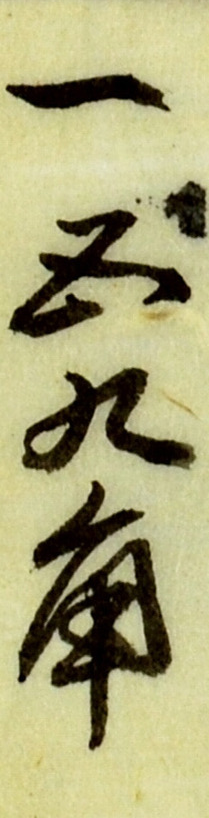一五七角
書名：材木川下ケ分一上納帳
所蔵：伊那市立高遠町図書館・合同会社AMANE
